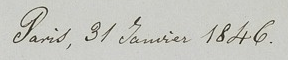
Paris, 31 Janvier 1846.
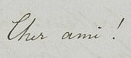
Cher ami!
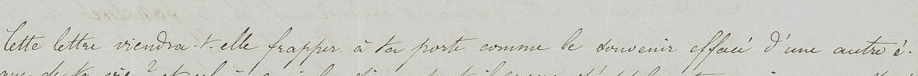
Cette lettre viendra-t-elle frapper à ta porte comme le souvenir effacé d'une autre é-
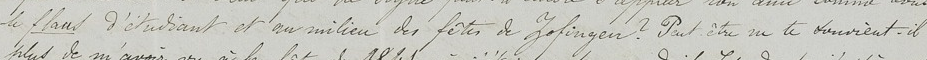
le flaus d'étudiant et au milieu des fêtes de Zofingen? Peut-être ne te souvient-il
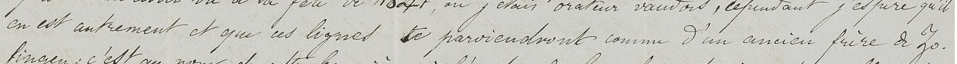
en est autrement et que ces lignes te parviendront comme d'un ancien frère de Zo-
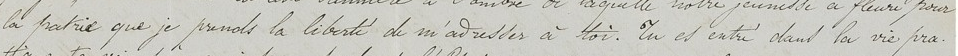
la patrie que je prends la liberté de m'adresser à toi. Tu es entré dans la vie pra-
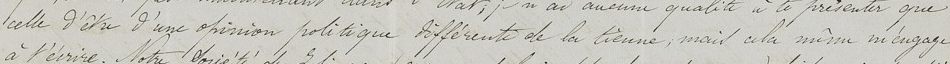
celle d'être d'une opinion politique différente de la tienne, mais cela même m'engage
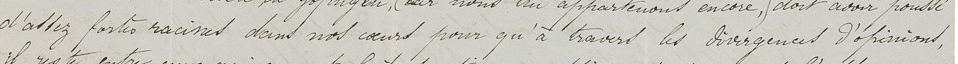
d'assez fortes racines dans nos cœurs pour qu'à travers les divergences d'opinions,
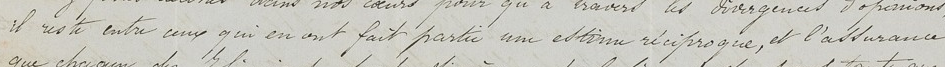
il reste entre ceux qui en ont fait partie une estime réciproque, et l'assurance
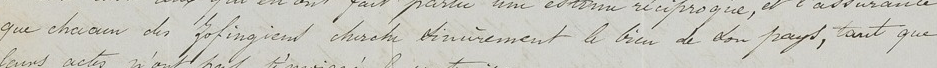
que chacun des Zofingiens cherche sincèrement le bien de son pays, tant que
